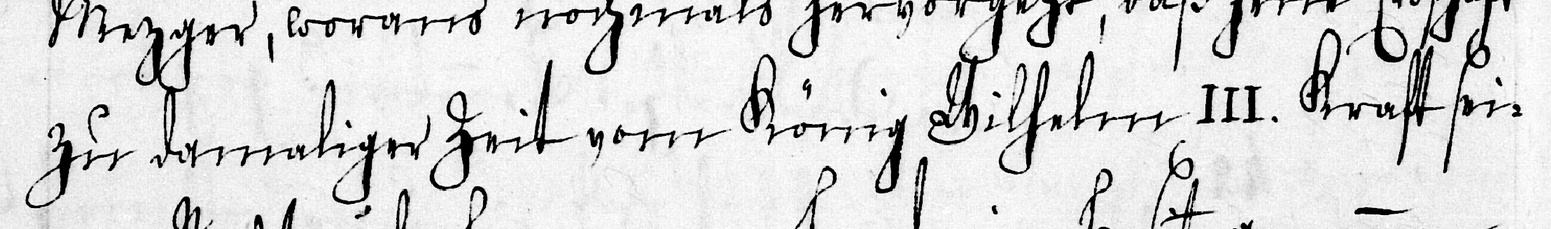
zu damaliger Zeit vom König Wilhelm III. Kraft sei¬
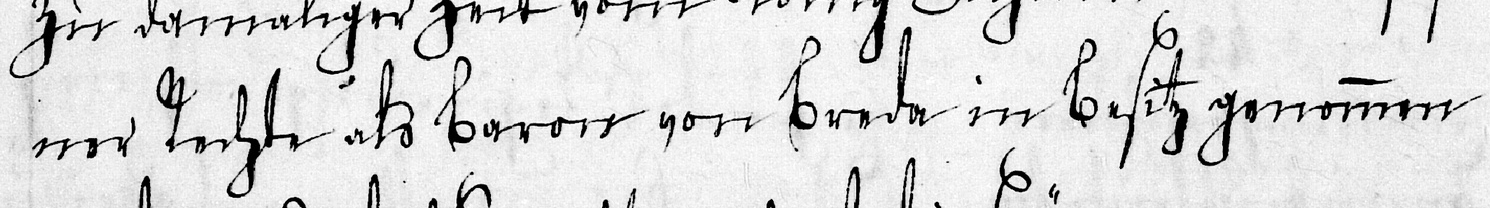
ner Rechte als Baron von Breda in Besitz genommen
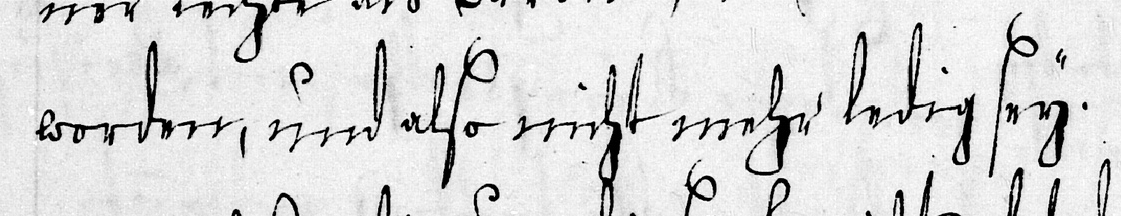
worden, und also nicht mehr ledig sey.
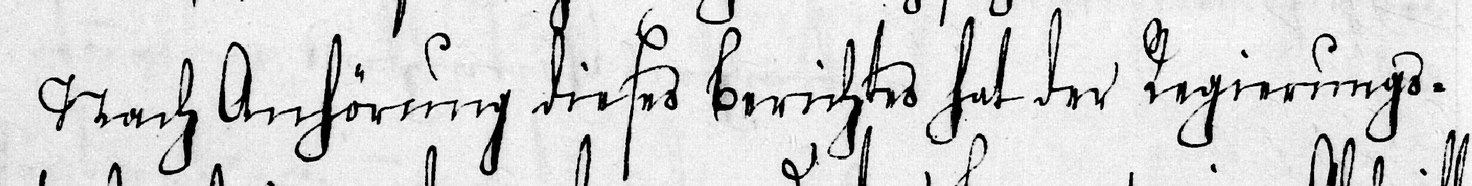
Nach Anhörung dieses Berichtes hat der Regierungs¬
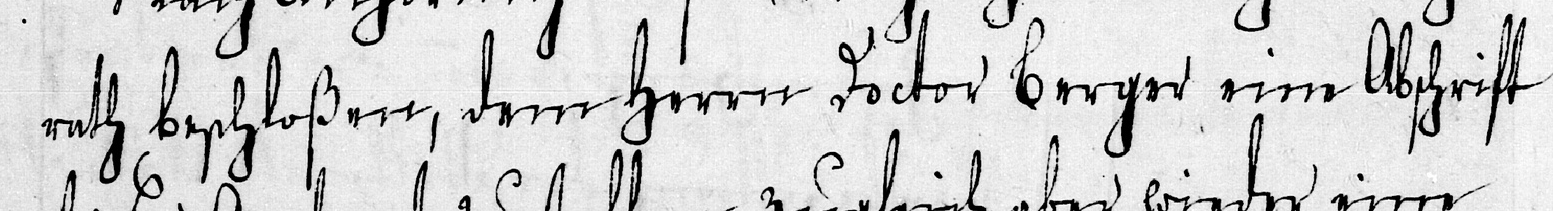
rath beschloßen, dem Herrn Doctor Berger eine Abschrift
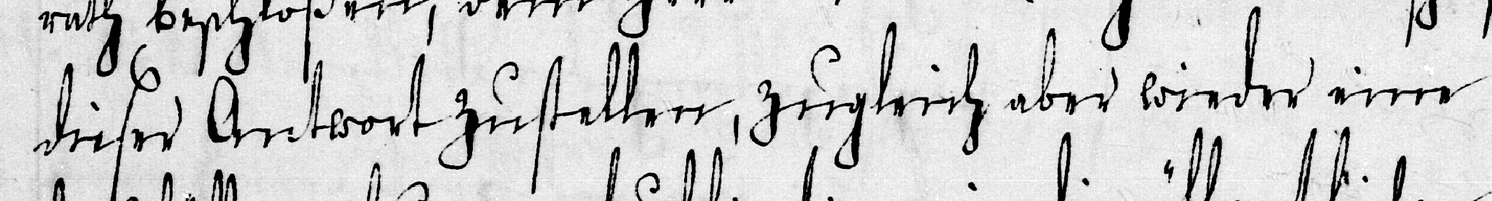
dieser Antwort zustellen, zugleich aber wieder eine
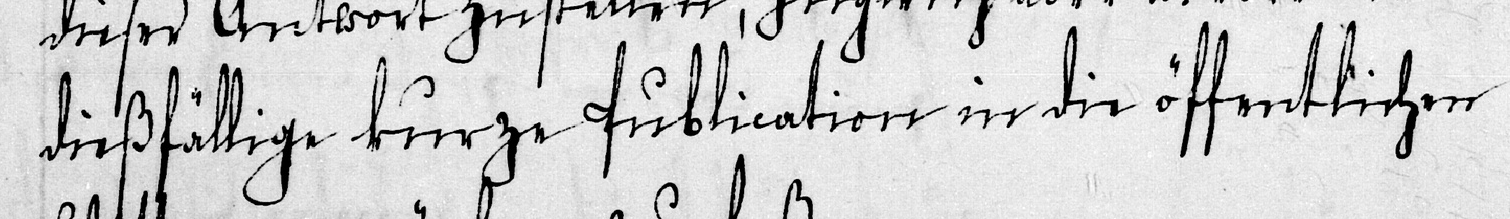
dießfällige kurze Publication in die öffentlichen
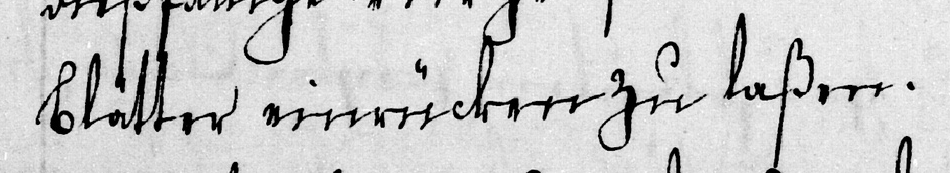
Blätter einrücken zu laßen.
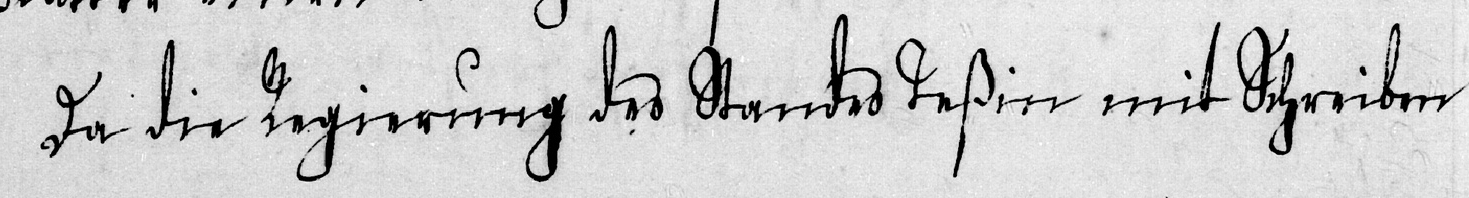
Da die Regierung des Standes Teßin mit Schreiben
